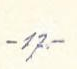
17
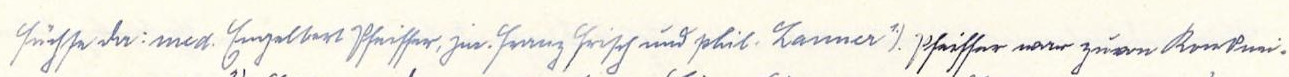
Füchse da. Mit Engelbert Pfeiffer, iur. Franz Frisch und phil. Lanner 1) Pfeiffer zuvor Konknei-
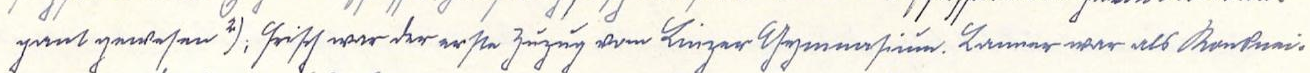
pant gewesen, Frisch der erste Zuzug vom Linzer Gymnasium. Lanner war als Konknei-
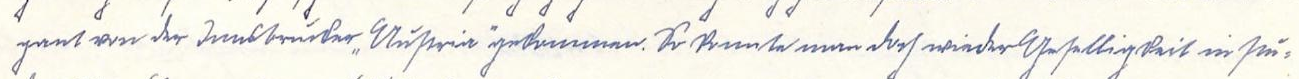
pent von der Innsbrucker Austriaaus der gekommen. So konnte man doch wieder Geselligkeit in stu-
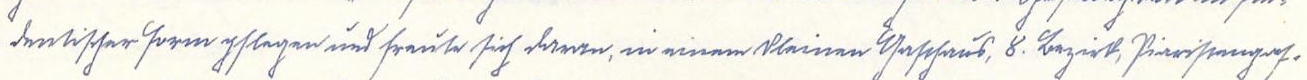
dentischer Form pflegen und freute sich in einem kleinen Gasthaus, 8. Bezirk, Piaristengas-
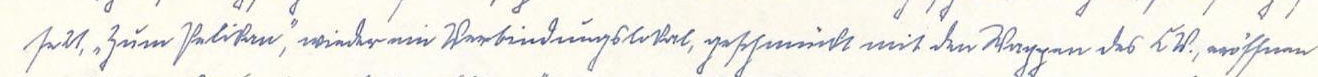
se 21, „zum Pelikan, wieder ein Verbindungslokal, geschmückt mit den Wappen des CV eröffnen
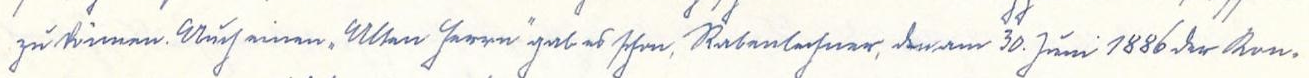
zu können. Auch einen „Alten Herrn“ gab es schon. Rabenlechner, den am 30. Juni 1886 der Kon-
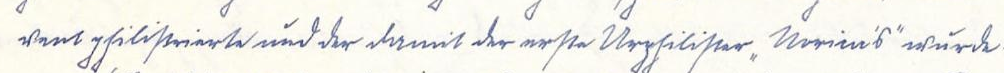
vent philistrierte und der damit der erste Urphilister „Noricas“ wurde.
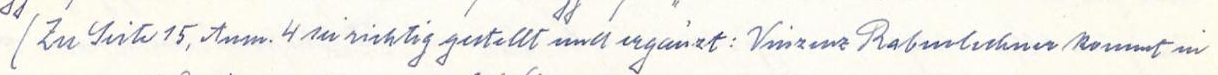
(Zu Seite 15, Anm. 4 sei richtiggestellt und ergänzt: Vinzenz Rabenlechner kommt im
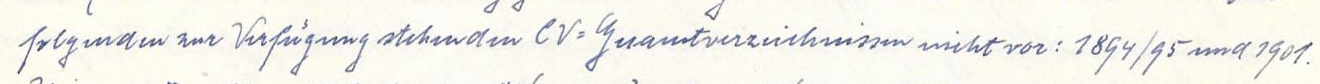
folgenden zur Verfügung stehenden CV-Gesamtverzeichnis nicht vor: 1894/95 und 1901.
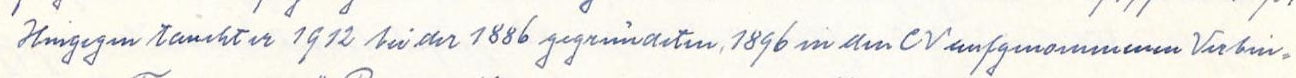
Hingegen taucht er 1912 bei der 1886 gegründeten, 1896 in den CV aufgenommenen Verbin-
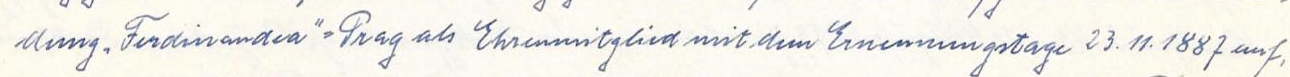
dung „Ferdinandea“ – Prag als Ehrenmitglied mit dem Ernennungstage 23. 11. 1887 auf
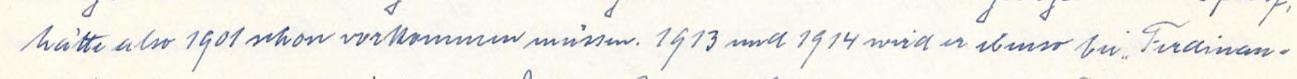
Hätte also 1901 schon vorkommen müssen. 1913 und 1914 wird er ebenso bei „Ferdinan-
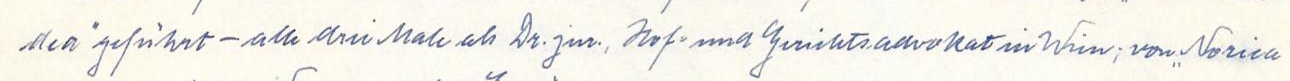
dea“ geführt - alle drei Male als Dr. iur, Hof- und Gerichtsadvokat in Wien; von „Norica“
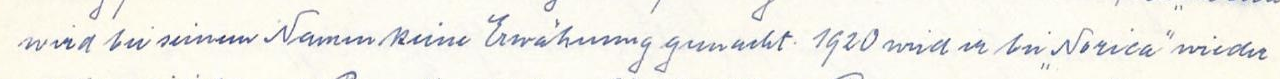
wird bei seinem Namen keine Erwähnung gemacht. 1920 wird er bei „Norica“ wieder
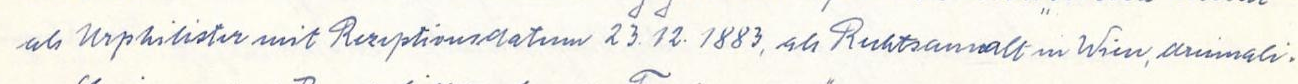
als Urphilister mit Rezeptionsdatum der 23.12.1883 als Rechtsanwalt in Wien ainmali (?)
